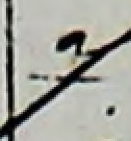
7
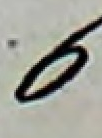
6
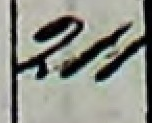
211
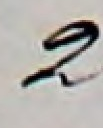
2
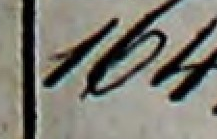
164
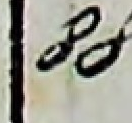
88
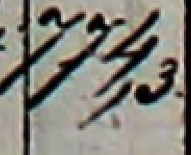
774,3
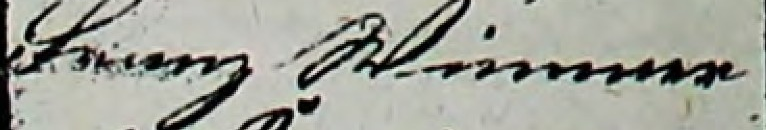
Franz Wimmer
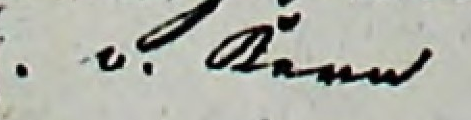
v. Kern
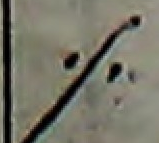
./.
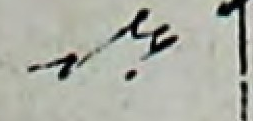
do
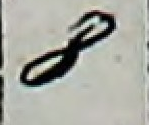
8
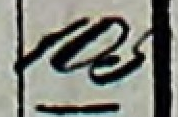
105
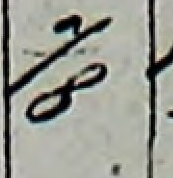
78
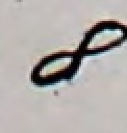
8
